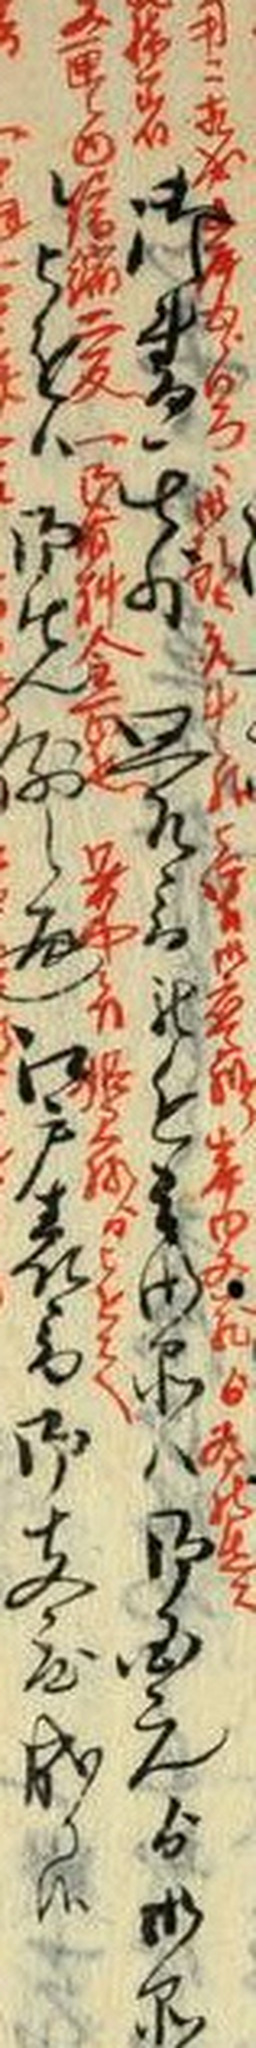被進ハ御先例之通江戸表ニ而御支度成り候
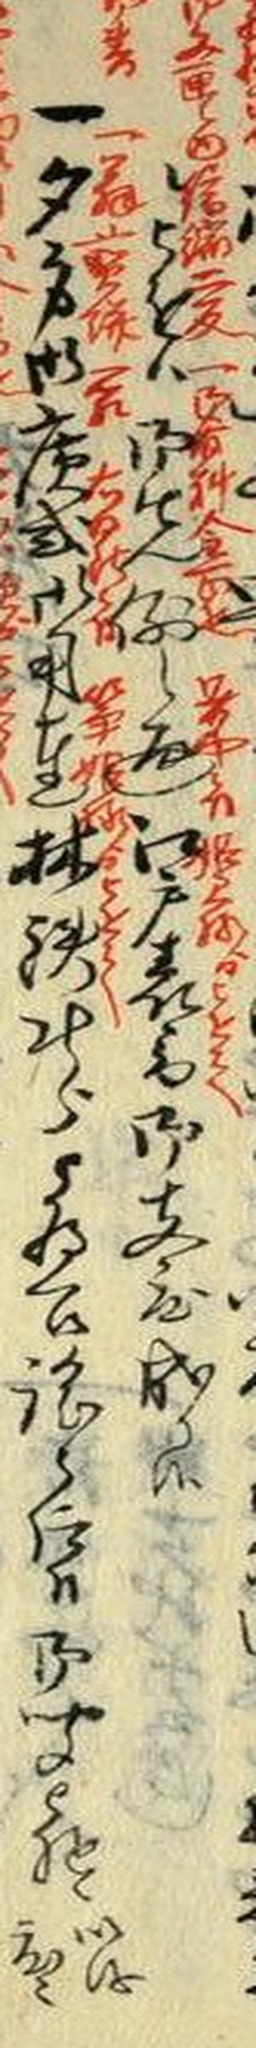一夕方御広式御用達林鉄次郎被為召謡被仰付候御聞被遊以後度々
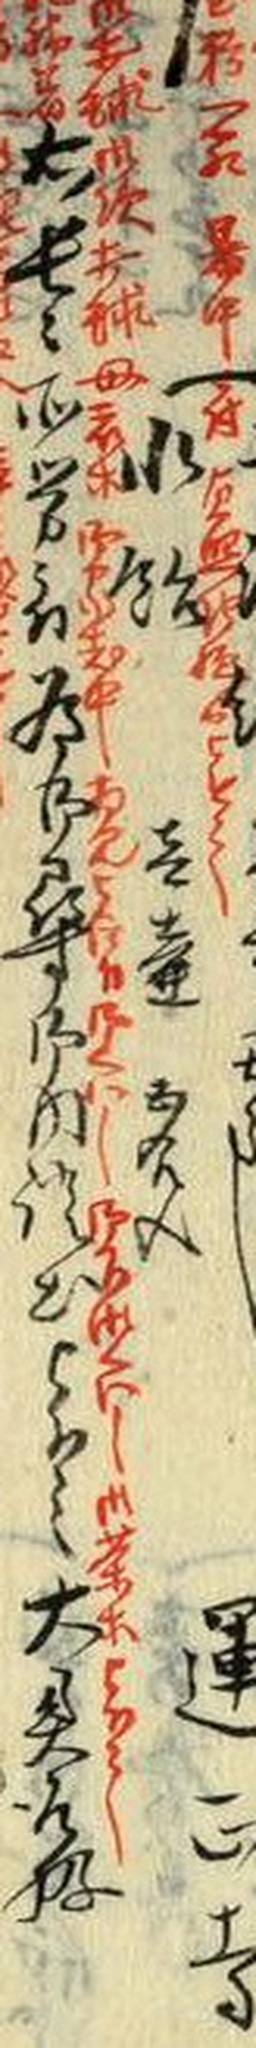右長々所労ニ付為御尋御内証出被下之大奥取扱
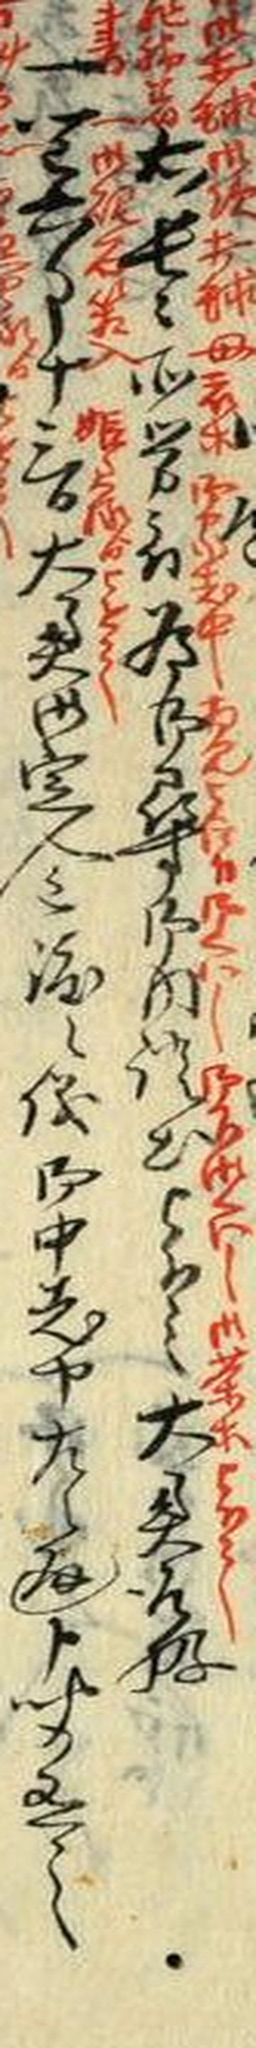一閏六月十三日大奥御定金渡之儀御中老中左之通申聞有之
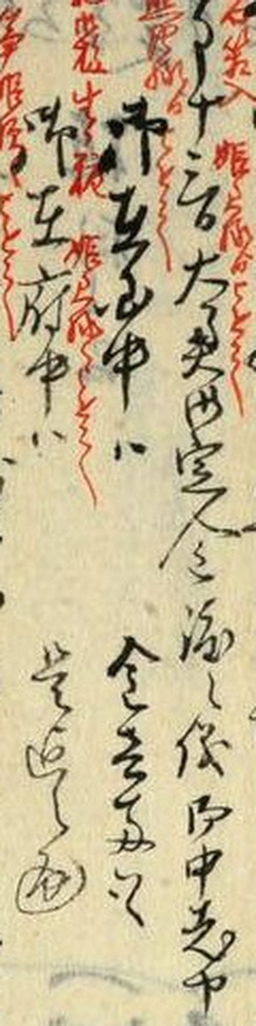御在国中ハ金壱両ツヽ
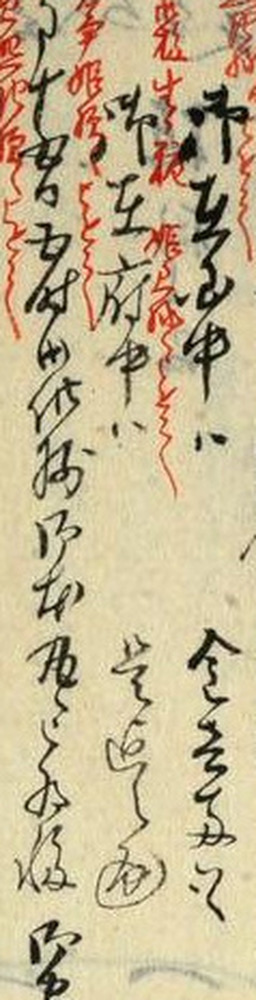御在府中ハ是迄之通
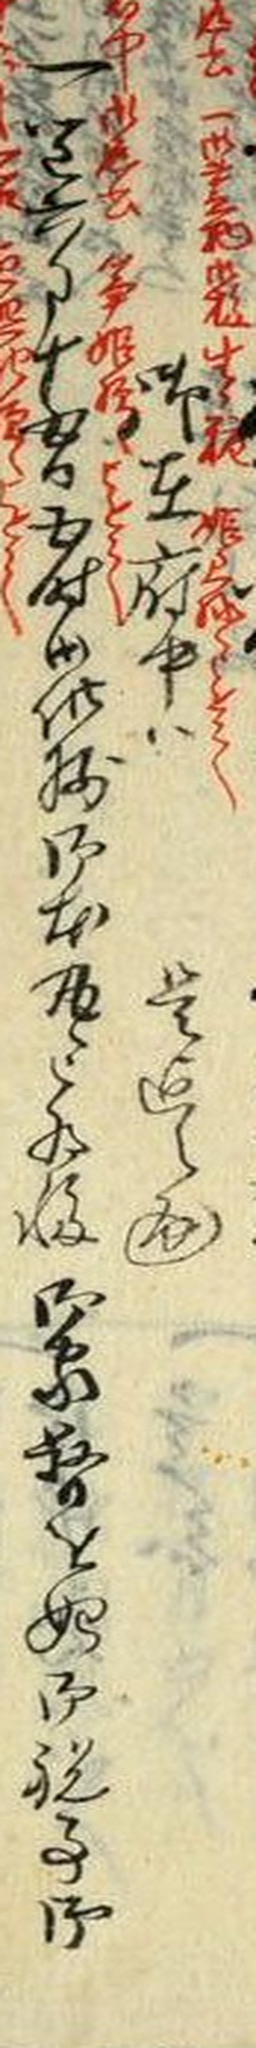一閏六月十五日五時御供揃御本丸へ被為移御家督を始御祝事御
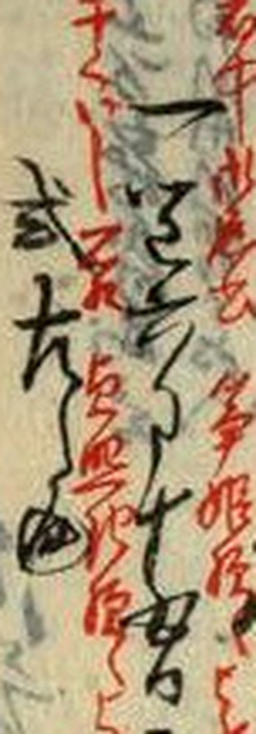式左之通
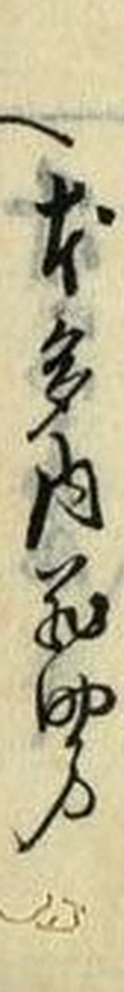本多内蔵助方

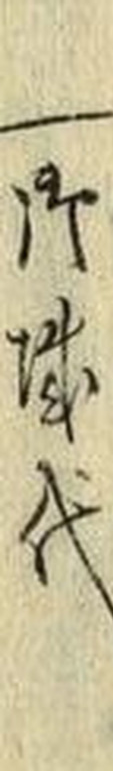御城代
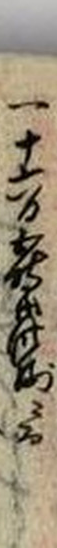一十六日五時御供揃ニ而
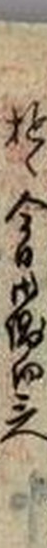遊候今日御側向三人
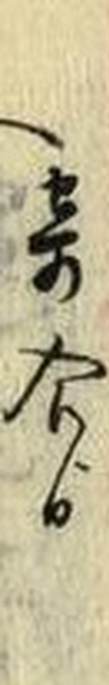寄合ゟ
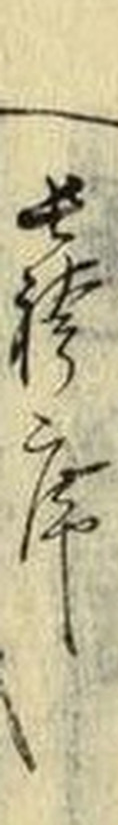長袴席
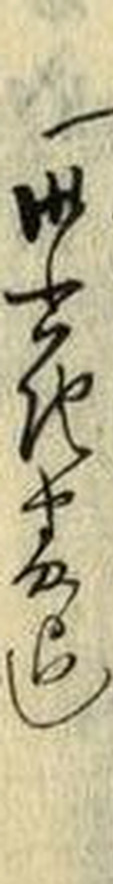御書院番迄
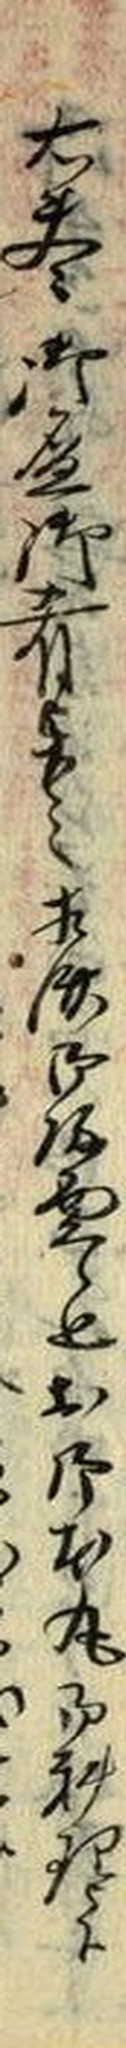右夫々御盃御肴被下之相済御帰殿之上於御本丸御料理被下
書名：少傅日録抄（斉承付側向頭取日記、在国）
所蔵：福井県文書館 Fukui Prefectural Archives
